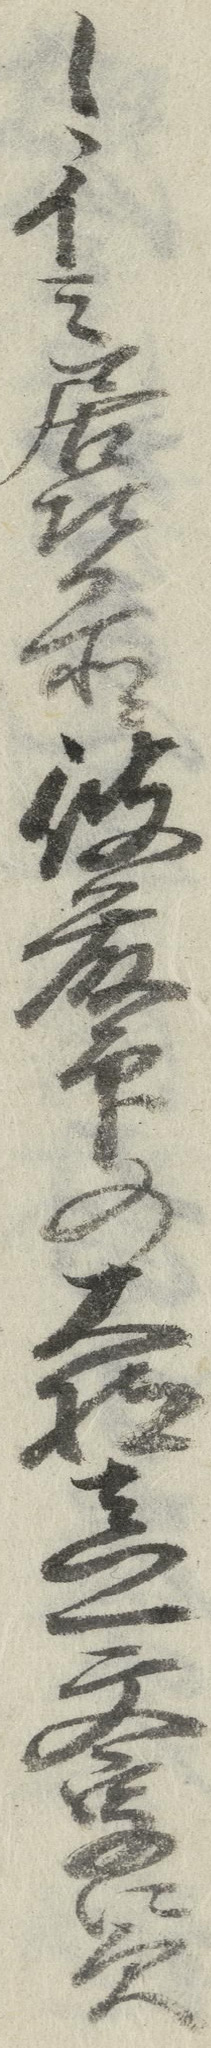し彳み居たる所に彼藤印の大将真一文字に欠
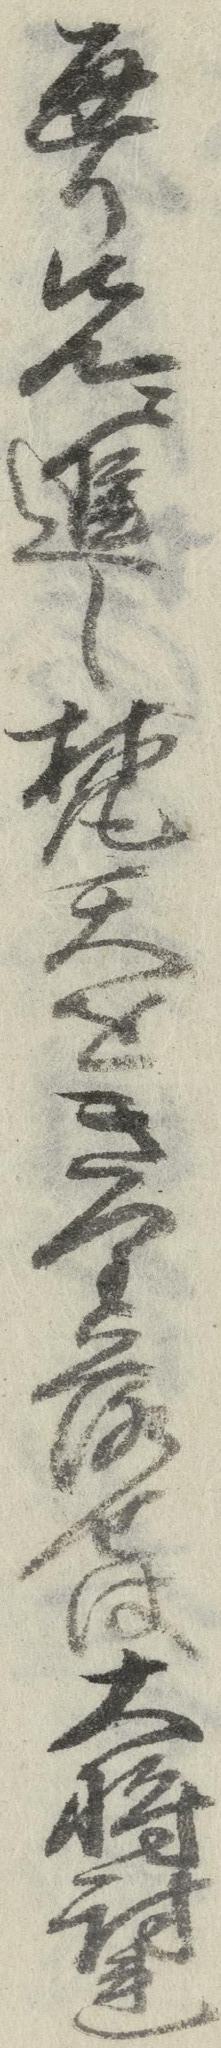通り先に進し梵天をきり落せは大将討れ
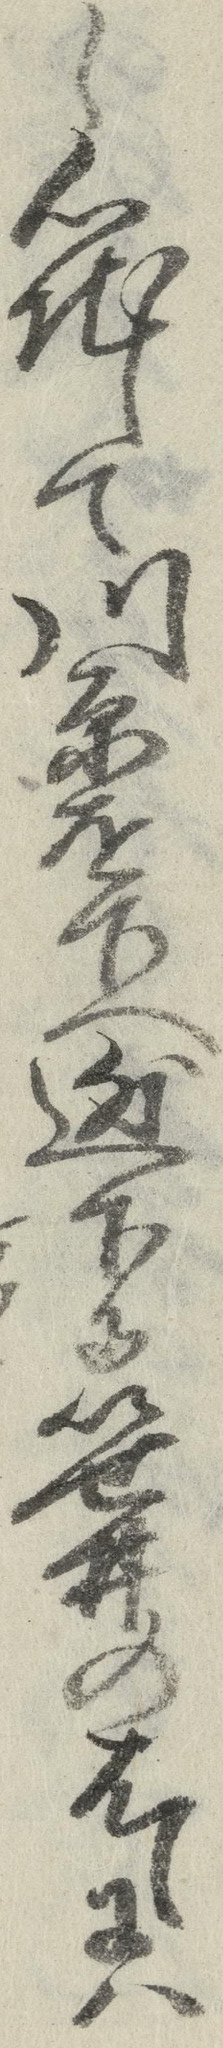し心地して川原を下へ迯下る笹井のはしには
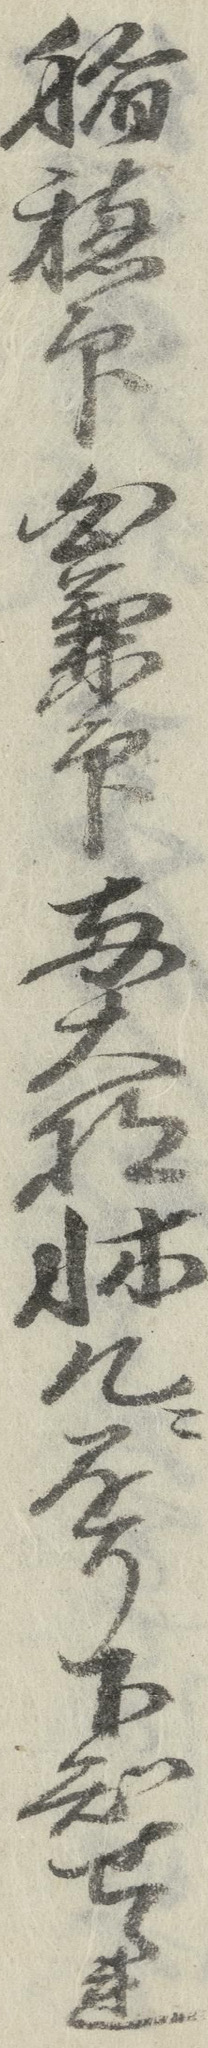稲穂印白菊印両大将牀几に懸り下知せられ
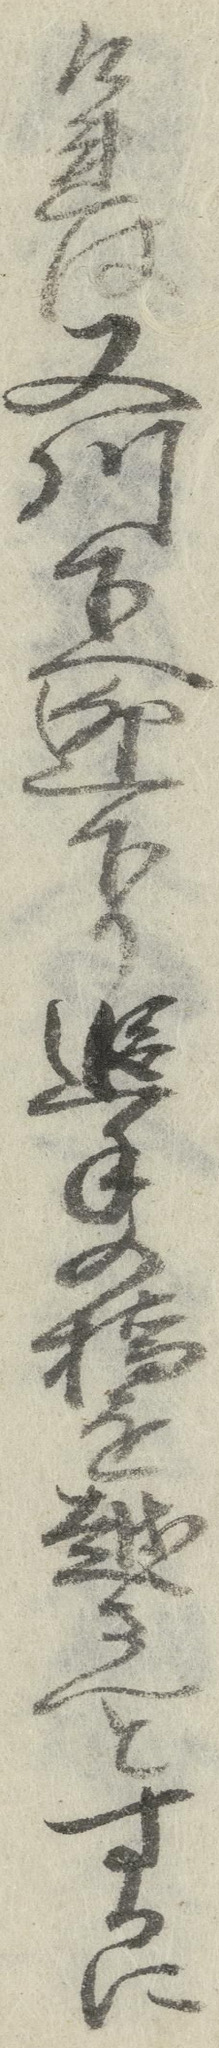けれは又川下へ迯下り追手の橋を越さんとするに
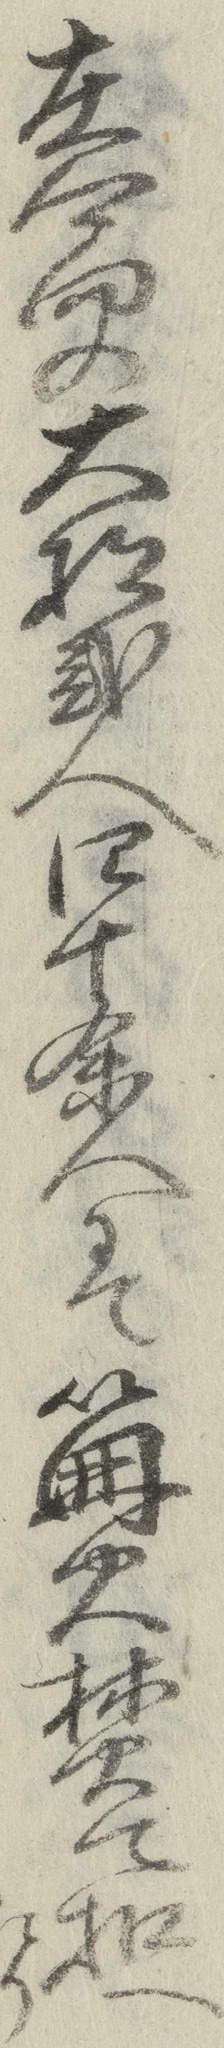在郷向の大将弐人四十余人にて篝火焚て扣へたり

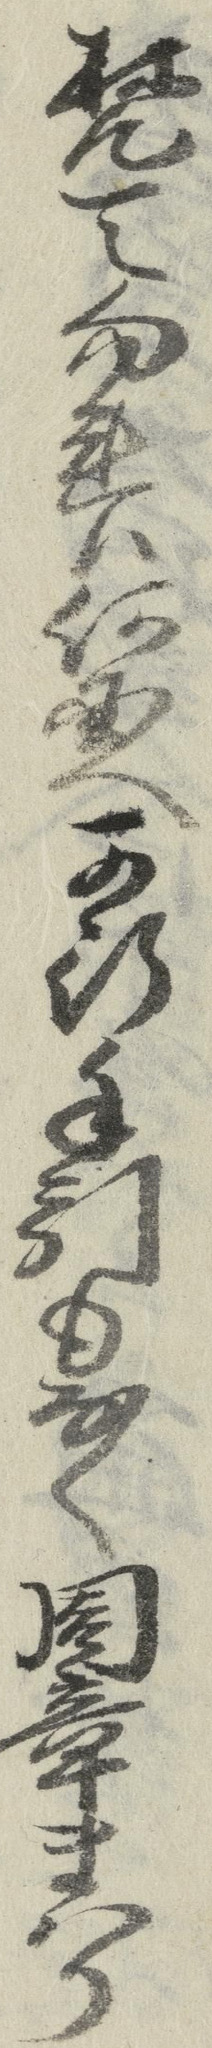梵天勿れは何国へ可行手引もなく周章まはり
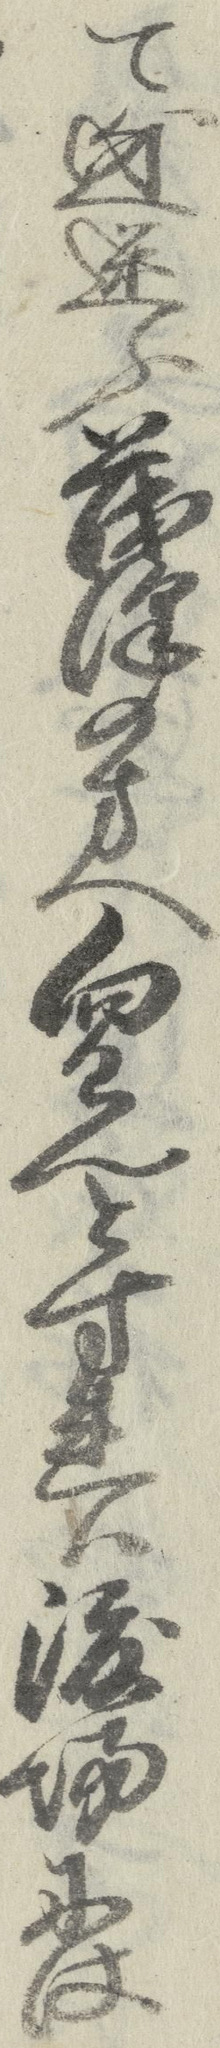て迯迷ふ茂沢の方へ向わんとすれは渡場には
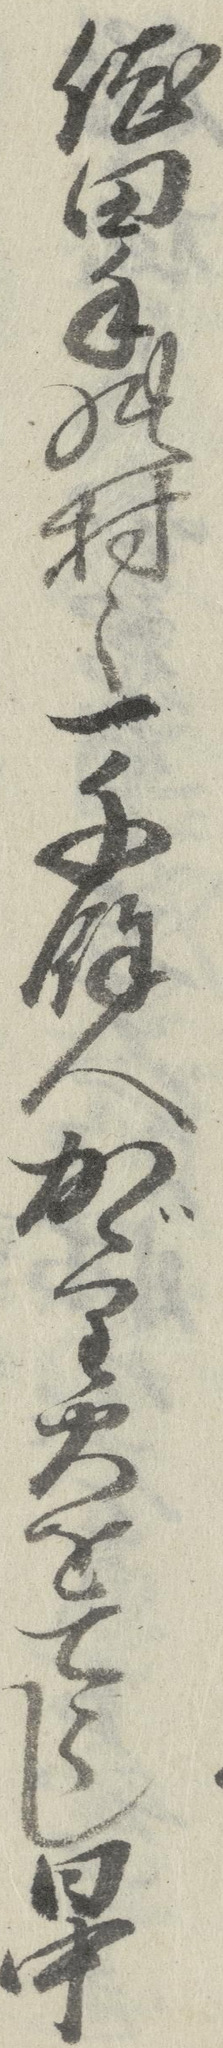依田手の村々一千餘人かゞり火をてらし日中
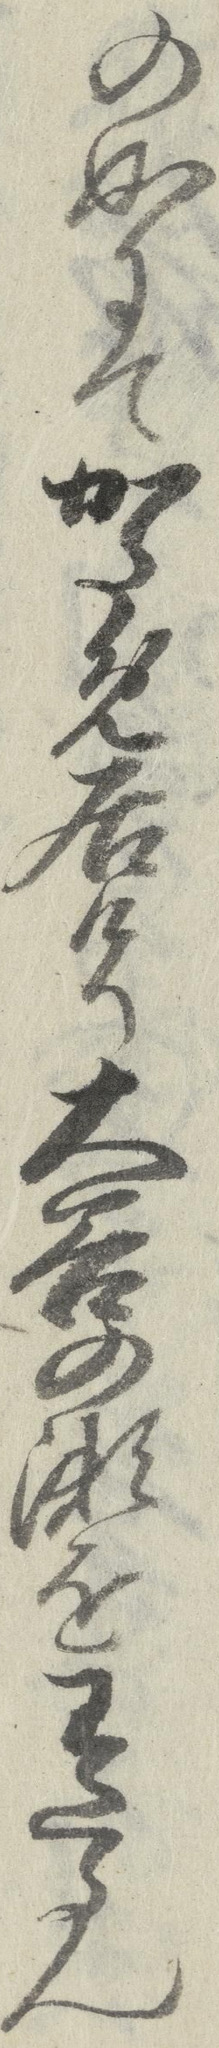の如にてかため居けり大谷の瀬をわたらん
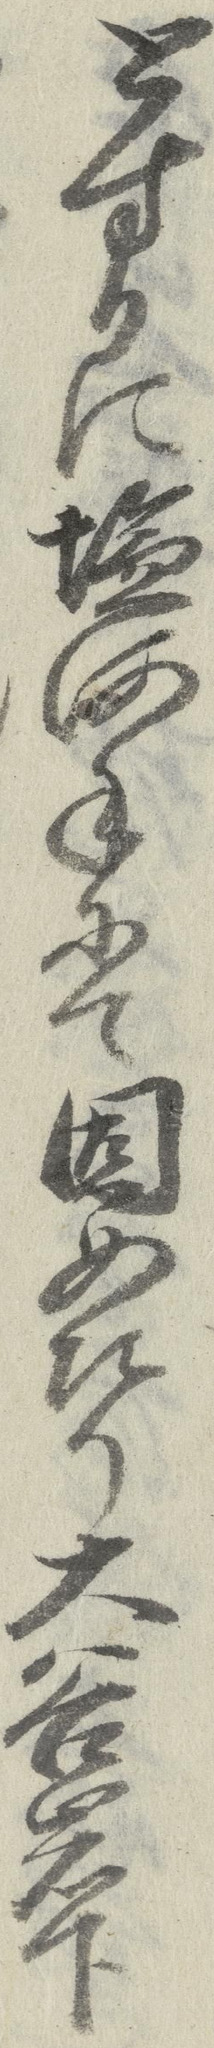とするに塩何手にて固めたり大谷岩下
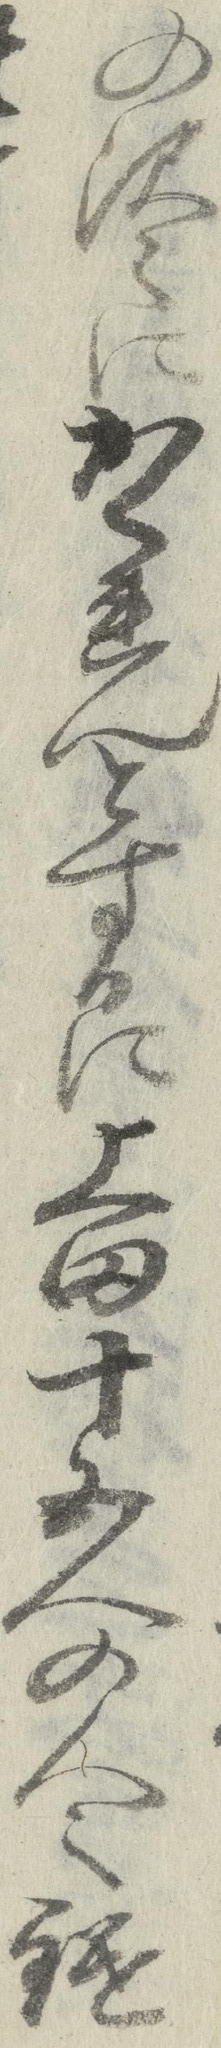の沢々にかくれんとするに上田十五人の人々鑓
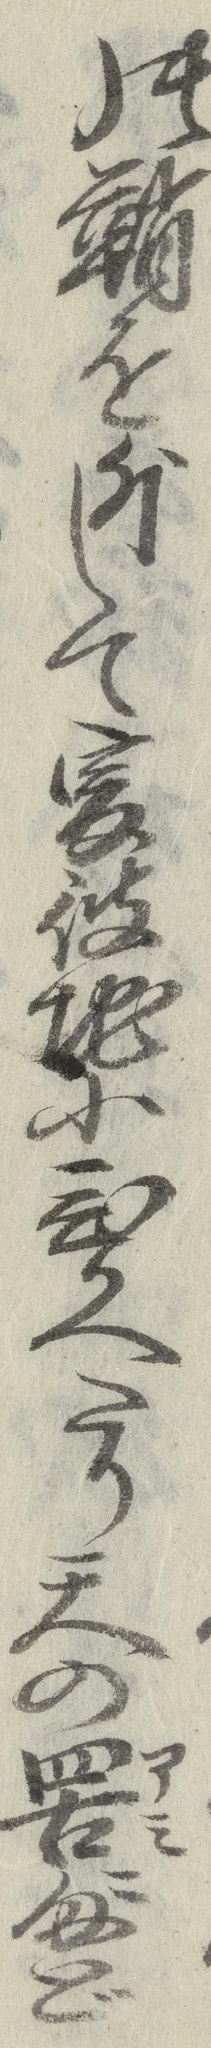の鞘を外して爰彼地にひかへたり天の罟にまど
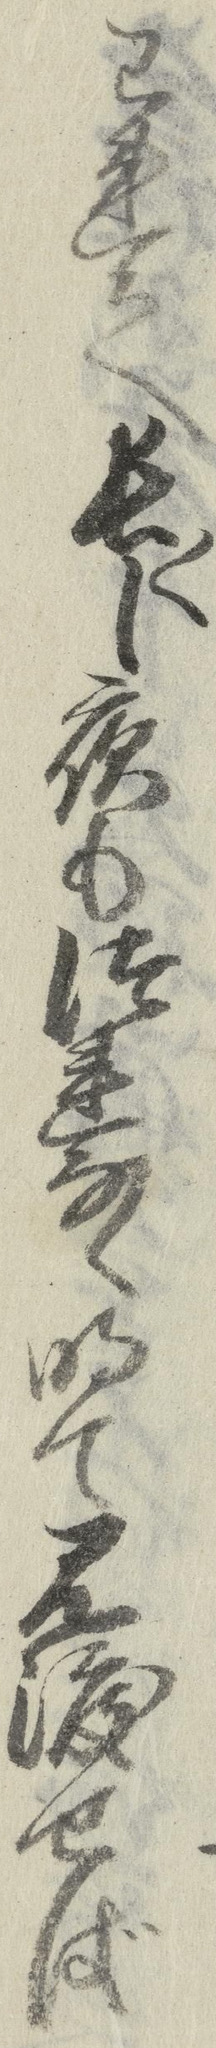われて長〳〵し夜もつれなく明て見渡せば
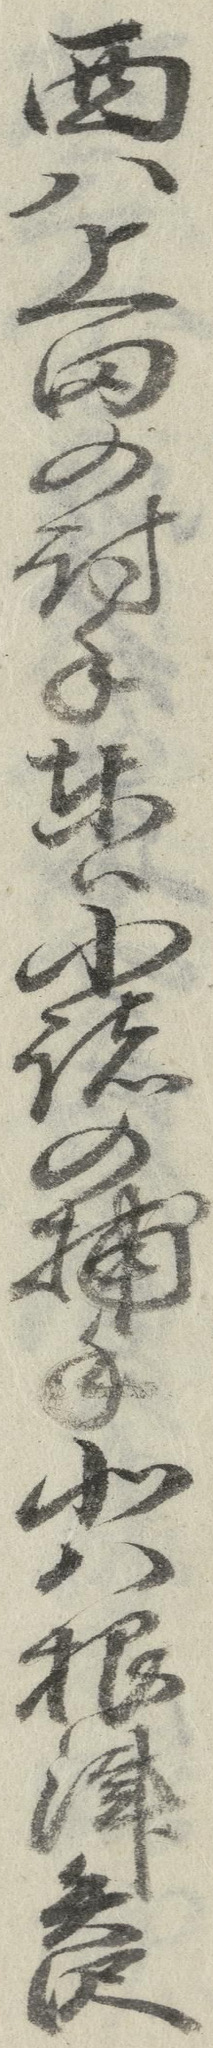西は上田の討手東ハ小諸の捕手北は根津矢沢
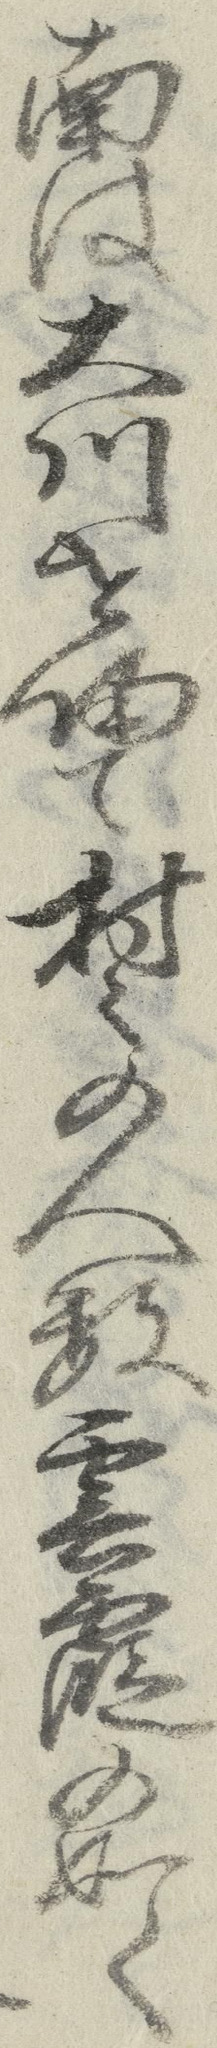南は大川を帰て村々の人数雲霞の如く
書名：浅間大焼騒動記　下
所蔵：東京大学地震研究所図書室 Earthquake Research Institute Library, The University of Tokyo, JAPAN
